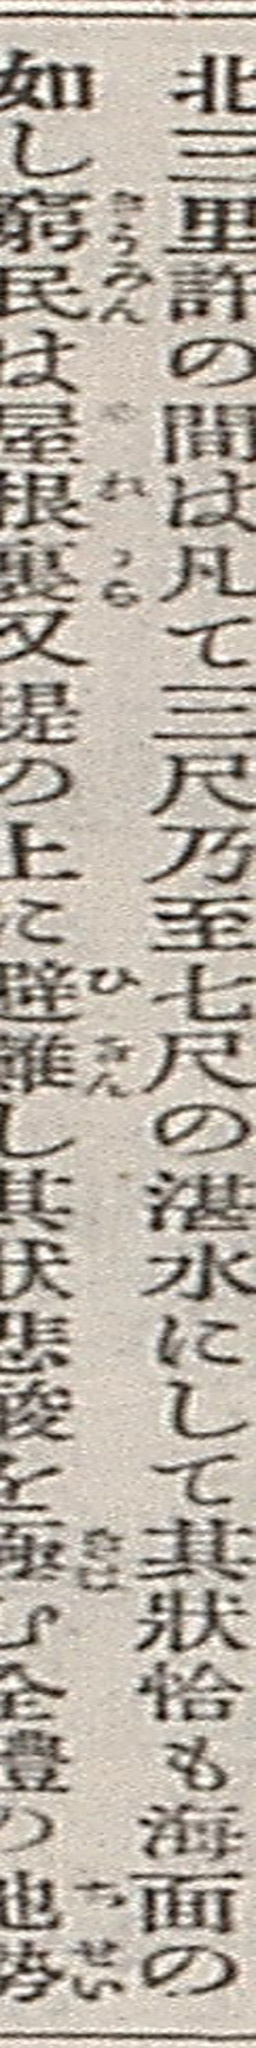如し窮民は屋根裏又堤の上に避難し其状悲酸を極む全体の地勢
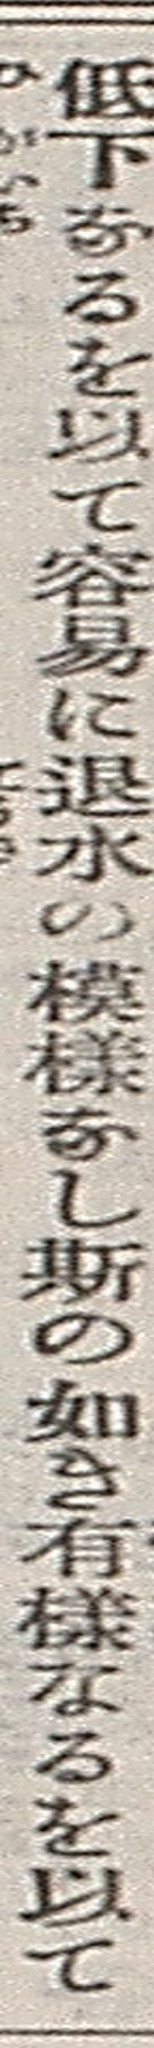低下なるを以て容易に退水の模様なし斯の如き有様なるを以て
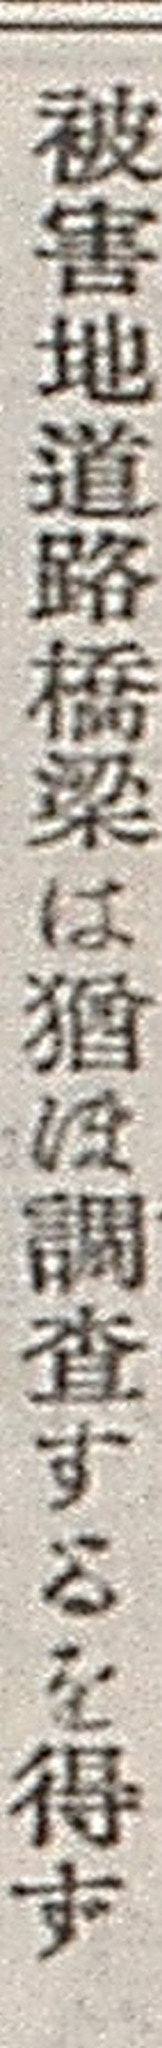被害地道路橋梁は猶ほ調査するを得ず
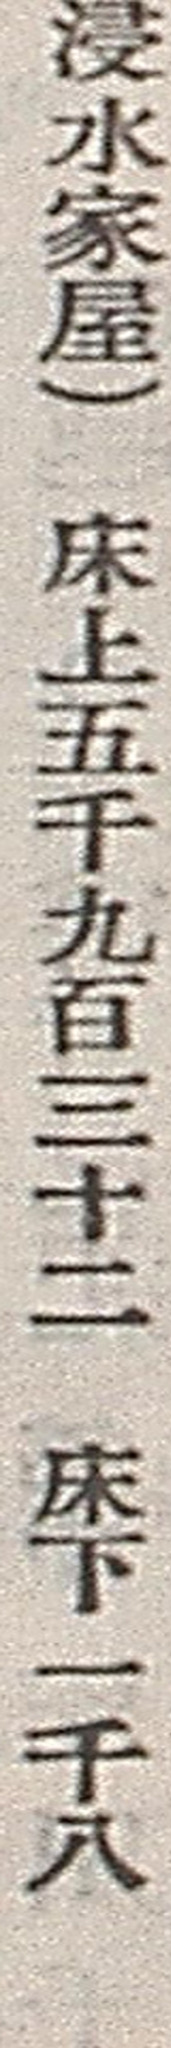床上五千九百三十二床下一千八
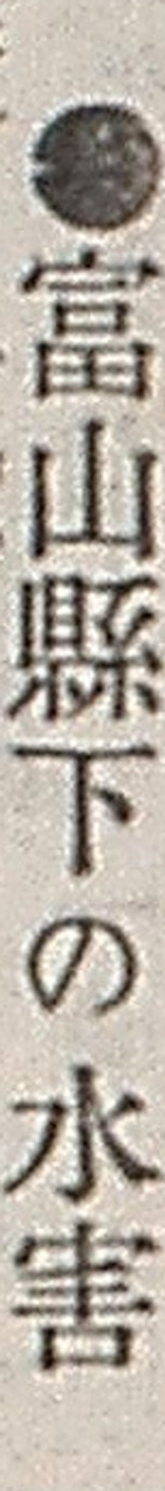●富山県下の水害
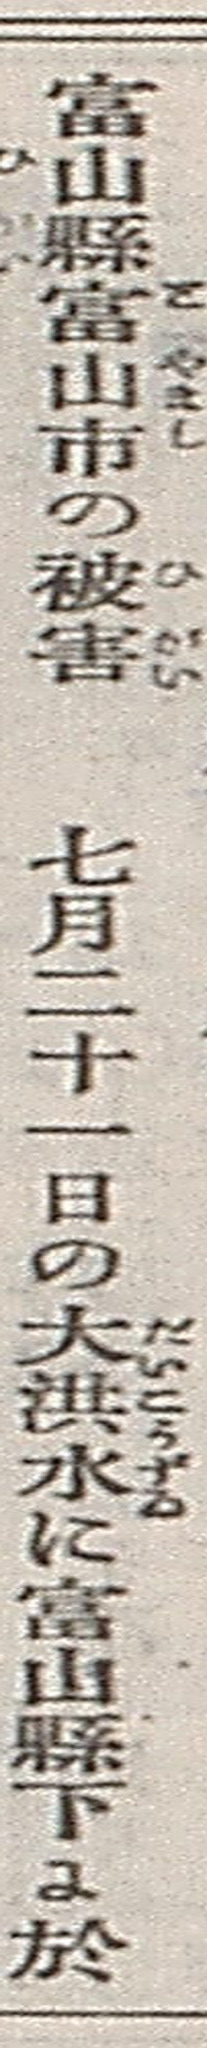富山県富山市の被害七月二十一日の大洪水に富山県下に於
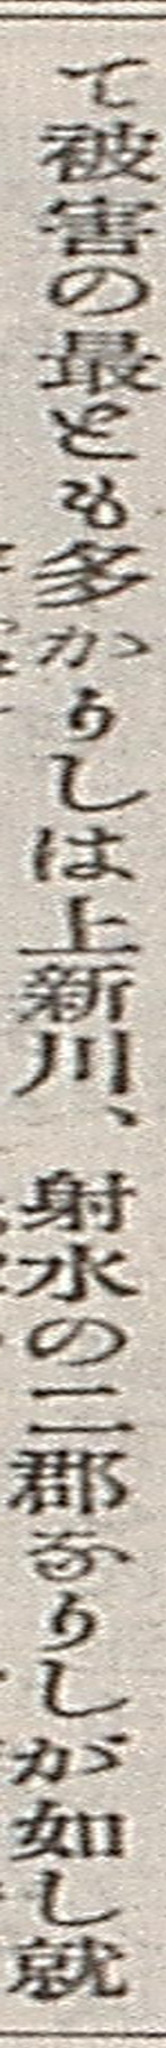て被害の最とも多かりしは上新川、射水の二郡なりしが如し就
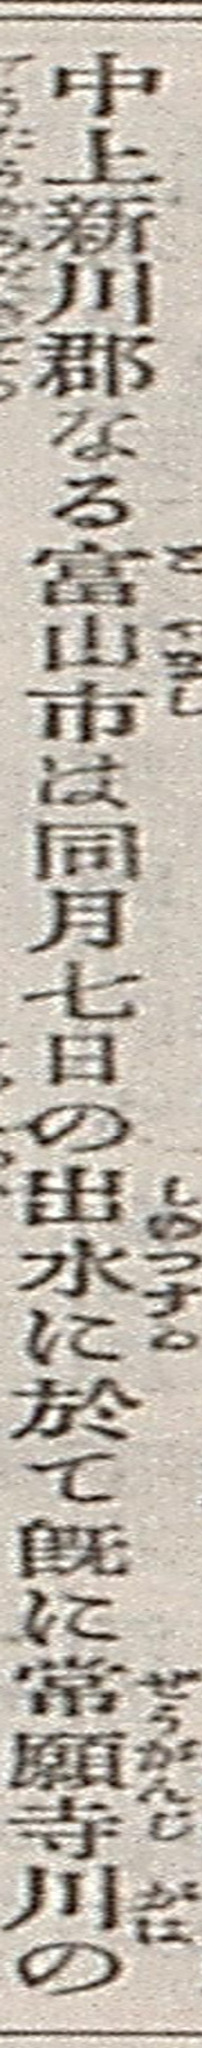中上新川郡なる富山市は同月七日の出水に於て既に常願寺川の
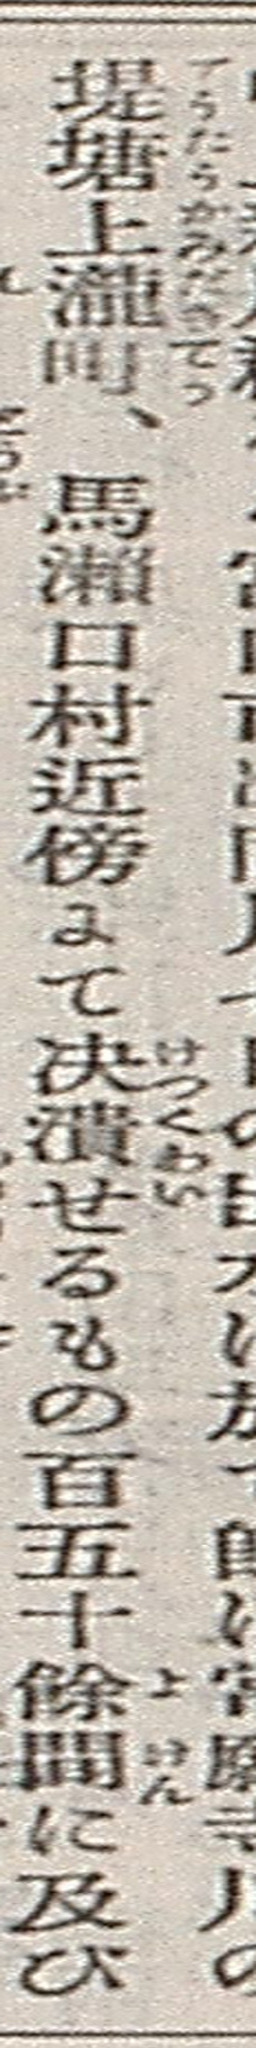堤塘上瀧町、馬瀬口村近傍にて决潰せるもの百五十餘間に及び
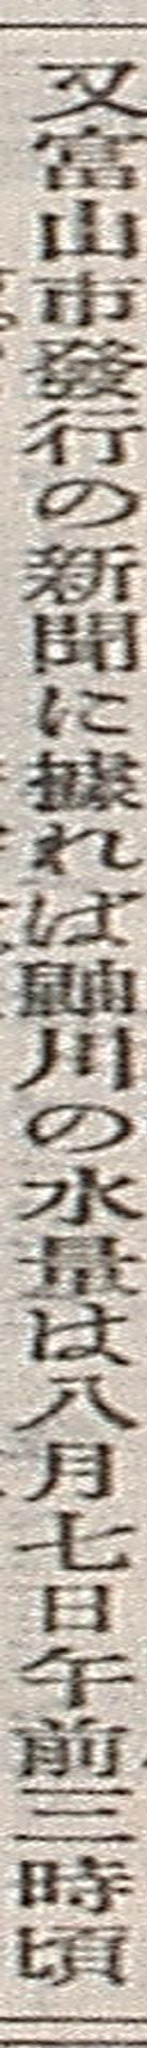又富山市発行の新聞に據れば鼬川の水量は八月七日午前三時頃
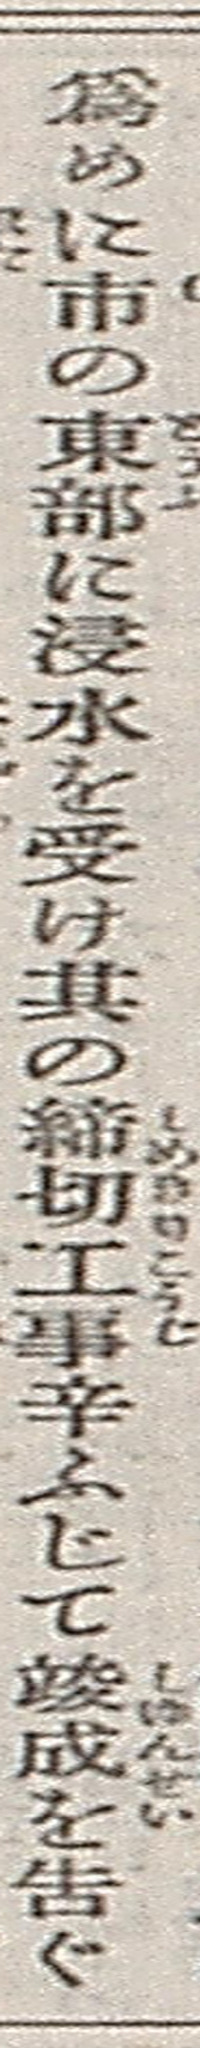為めに市の東部に浸水を受け其の締切工事辛ふじて竣成を告ぐ
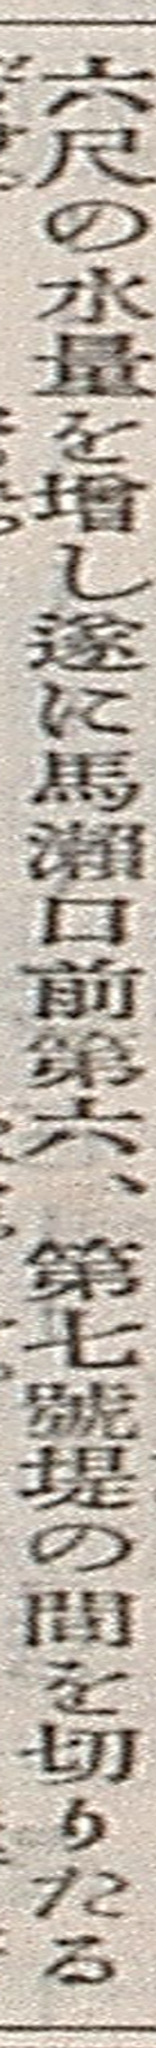六尺の水量を増し遂に馬瀬口前第六、第七号堤の間を切りたる
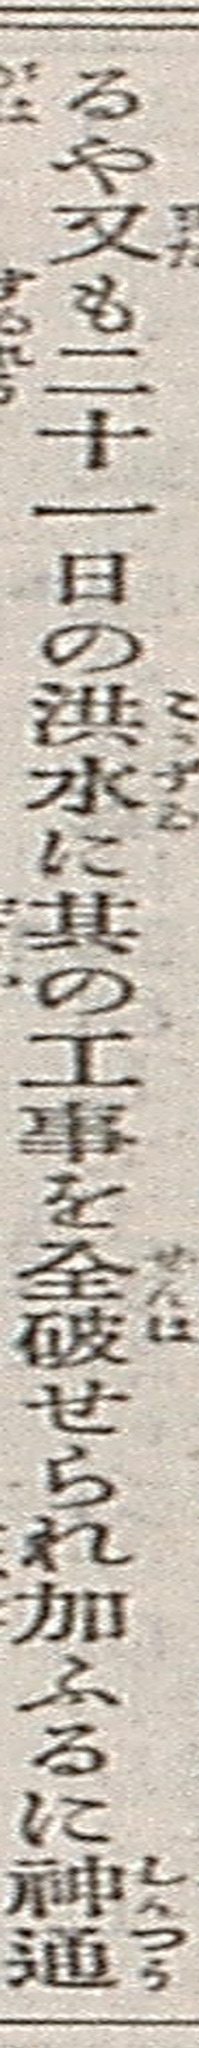るや又も二十一日の洪水に其の工事を全破せられ加ふるに神通
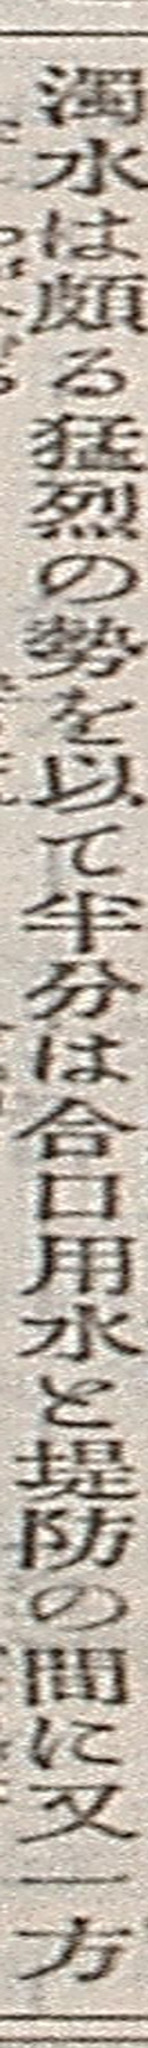濁水は頗る猛烈の勢を以て半分は合口用水と堤防の間に又一方
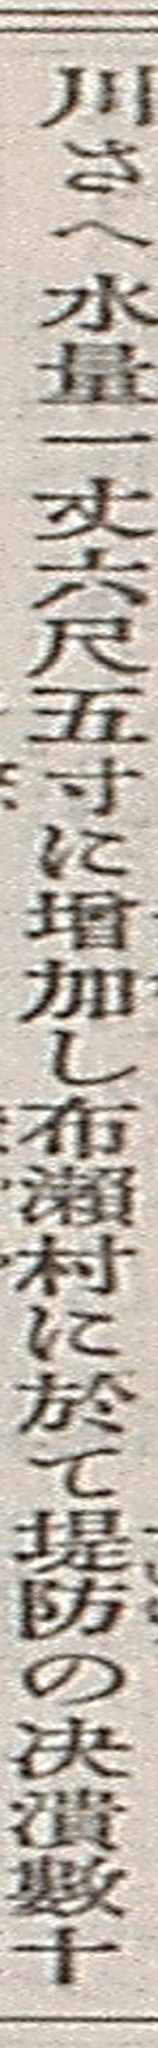川さへ水量一丈六尺五寸に増加し布瀬村に於て堤防の决潰数十
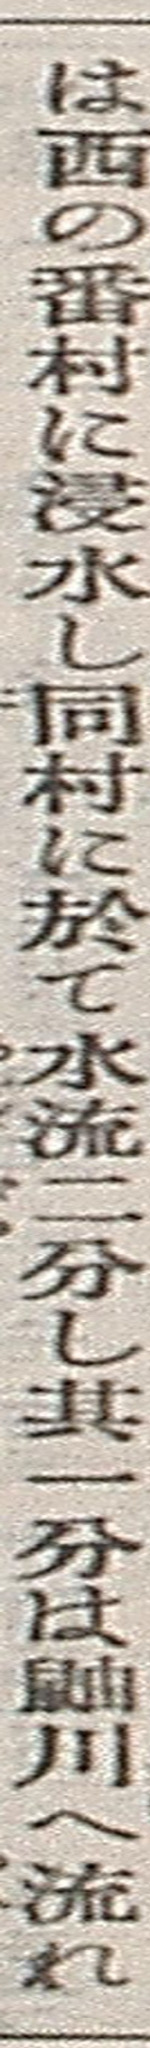は西の番村に浸水し同村に於て水流二分し其一分は鼬川へ流れ
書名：風俗畫報臨時増刊第百二十八號　洪水被害録（下）
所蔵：東京大学地震研究所図書室 Earthquake Research Institute Library, The University of Tokyo, JAPAN
